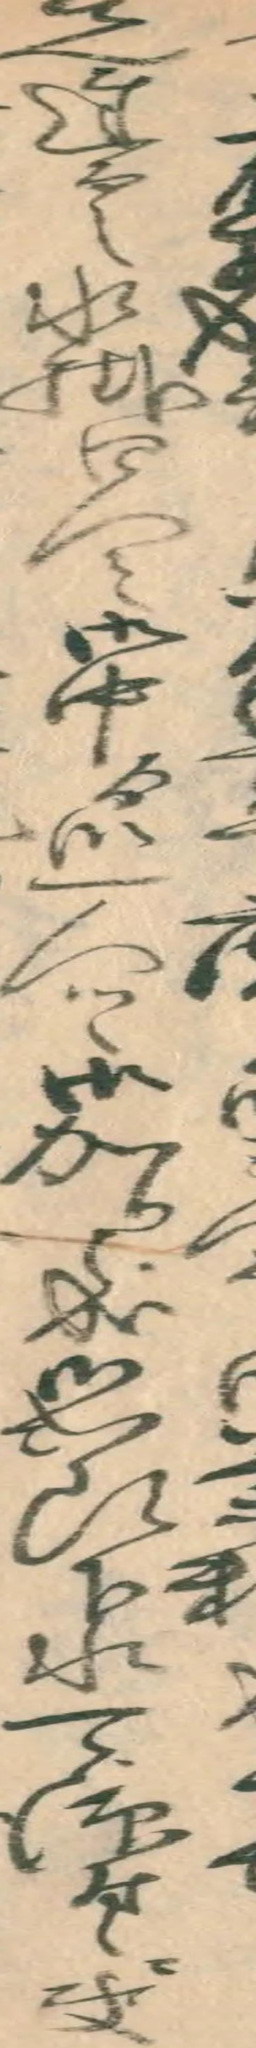先達而之水掛四人之御中ゟ御一人ツヽ御加り被成御出頭下水可被仰付候ニ決
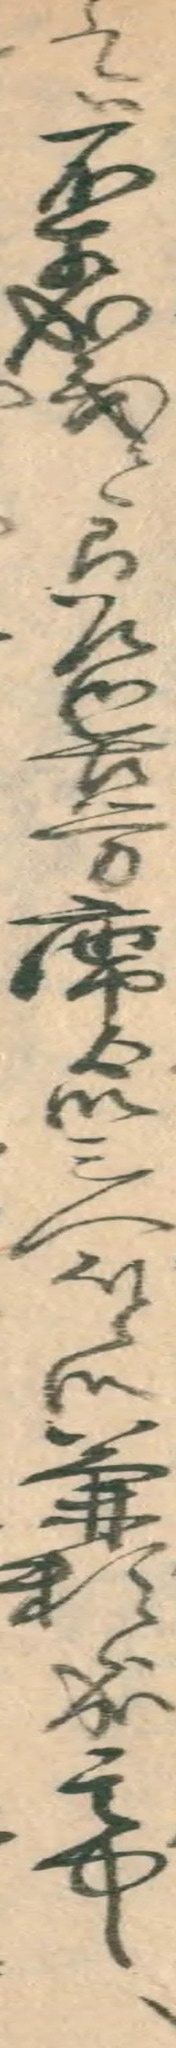候てハ不相成義ニ候間乍御苦労席ゟ御三人ほと御兼頼被成其中へ
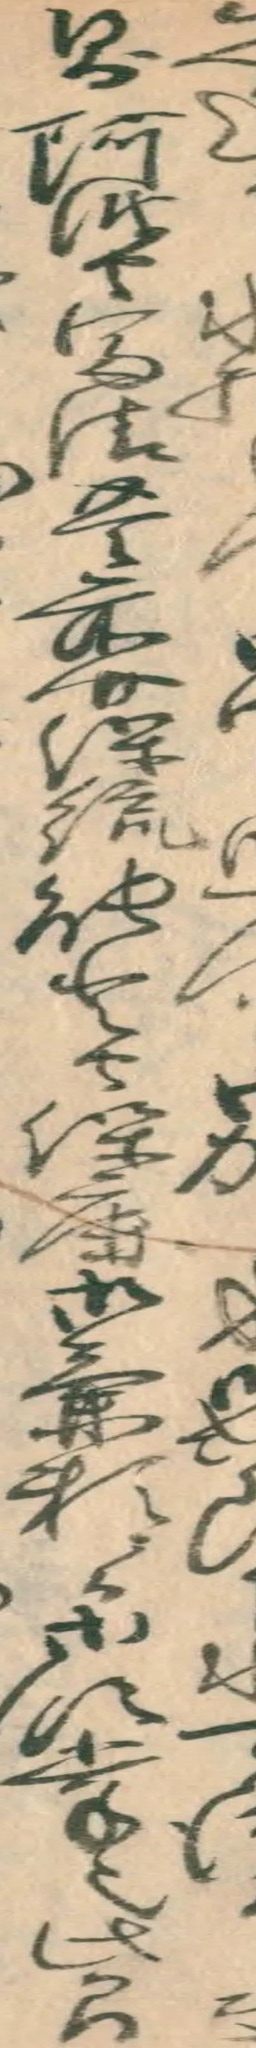則阿波守富清豊前介保統能登守保鹿御兼頼ニ而御領掌也此間
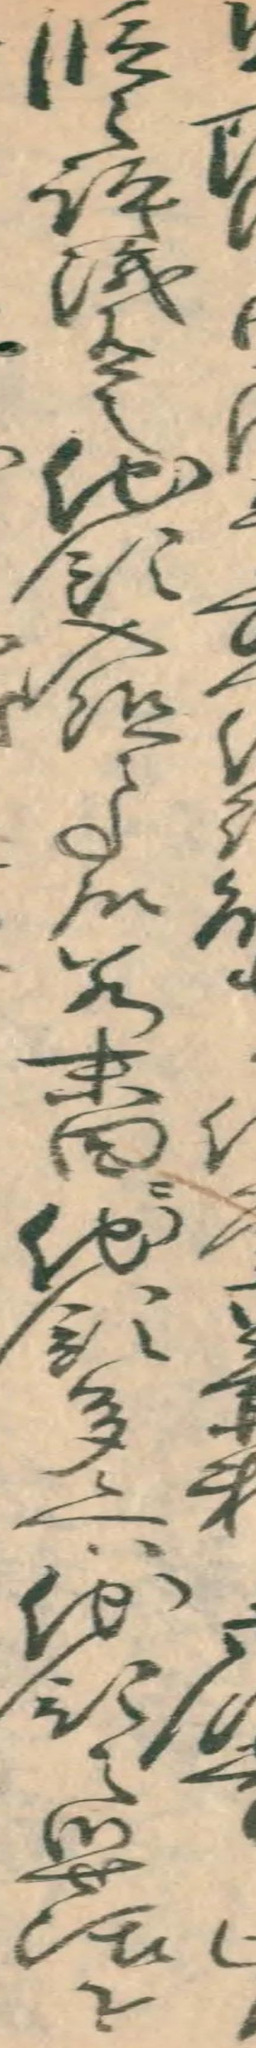段々評議有之他領入組候事故若末田ニ他領多候ヘハ他領之御世話を
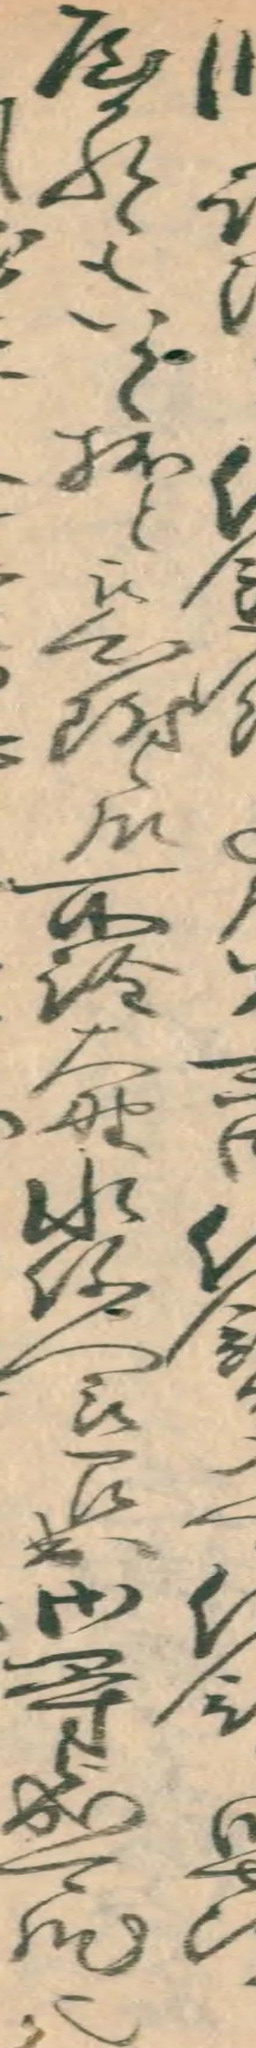やかれ候もいかゝ抔と被心付候故所詮大野水役人被召出御尋被成可然也
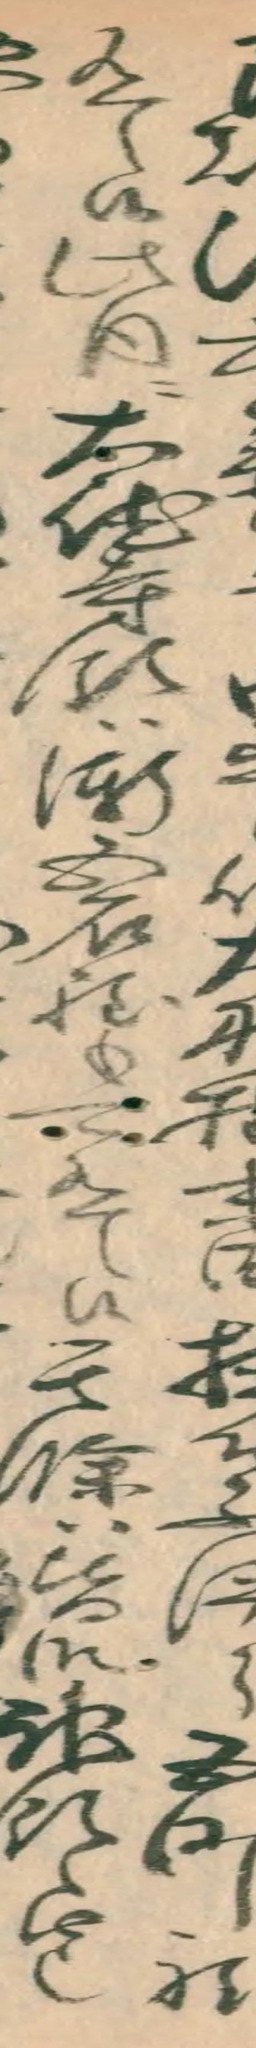有之候此内ニ大徳寺領ハ漸五石程も可有之候其余ハ皆御神領之由也
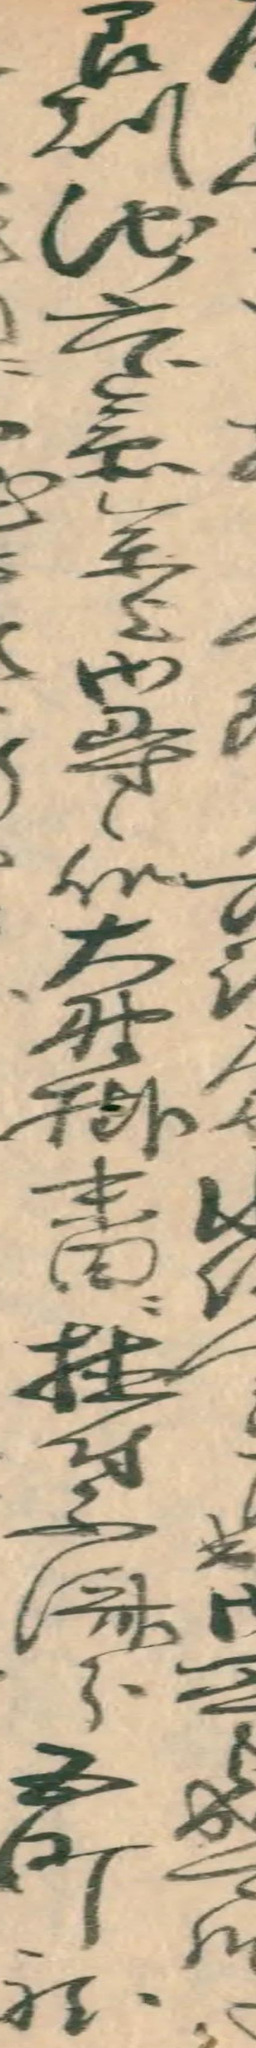即刻池ノ六郎兵衛参上御尋候処大野掛末田ニ植付不済分五町程
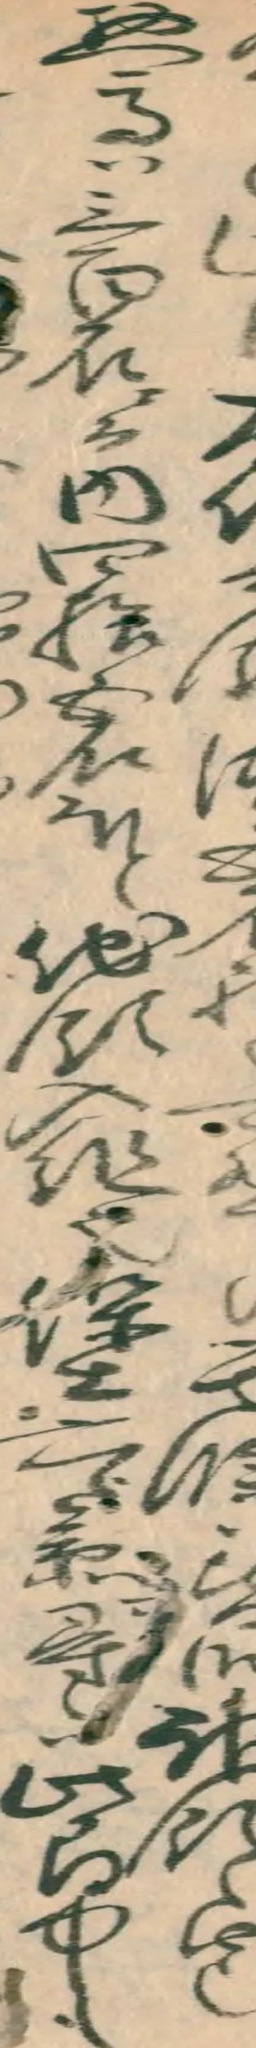惣高ハ三百石ニ而内四拾五石ほと他領入組也保土六郎兵衛ニ尋候ハ此間中も
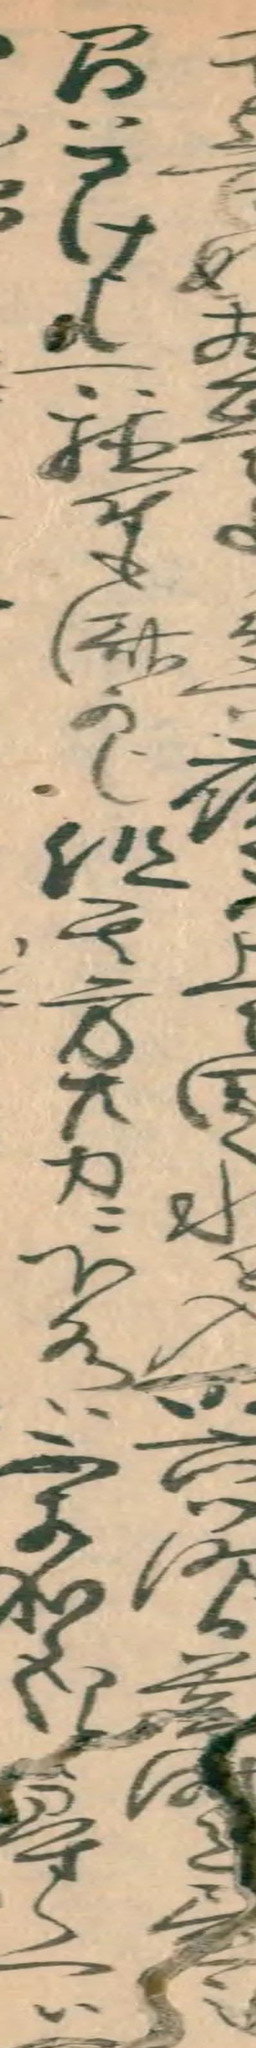間ハさけ申候ヘハ植付も済可申候但其方共力ニ下水ハ不相成候哉と尋候へハ
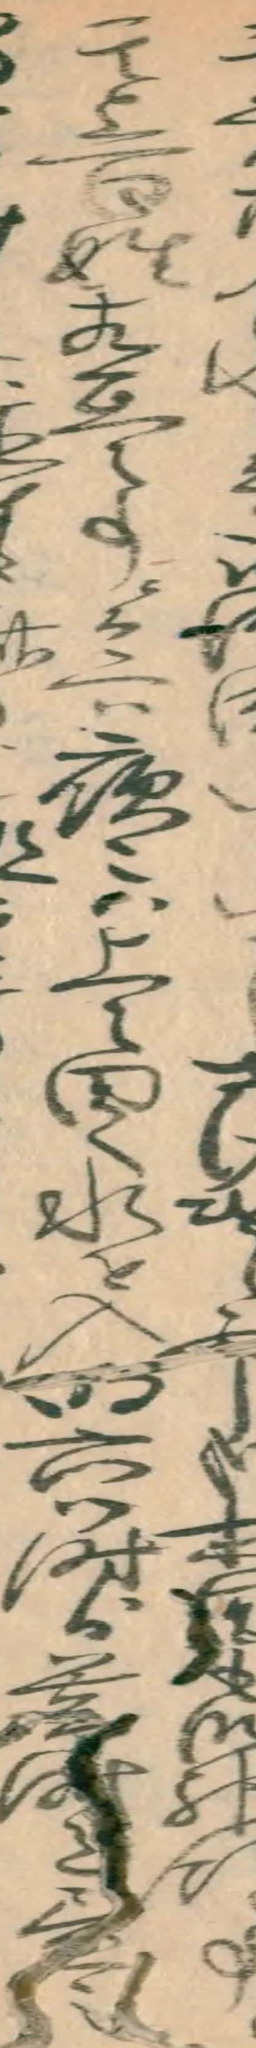其上百姓相互之事ニ而候ヘハ夜々ハ上之田へ水を入明六ツ時ゟ暮時迄昼之
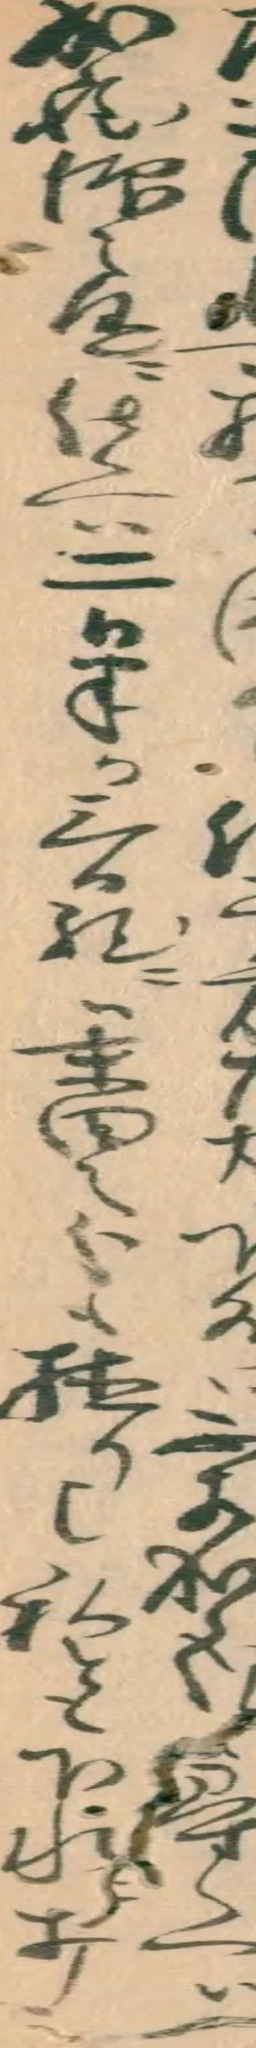成程仰之通ニ仕候ヘハ二日半か三日程ニハ末田之分も植り申候私とも下水ニ打
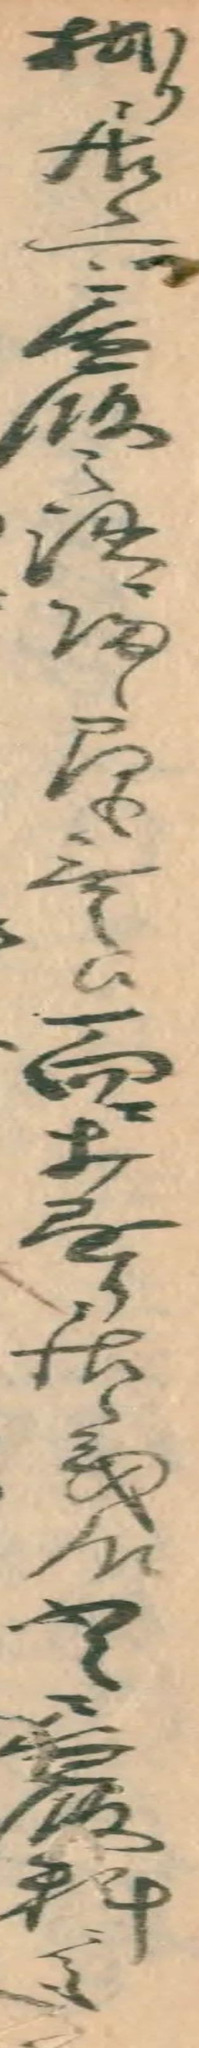掛り居候へハ昼飯之認ニ帰候間も無之候一向ニ打懸り居候義故少々昼飯料ニても
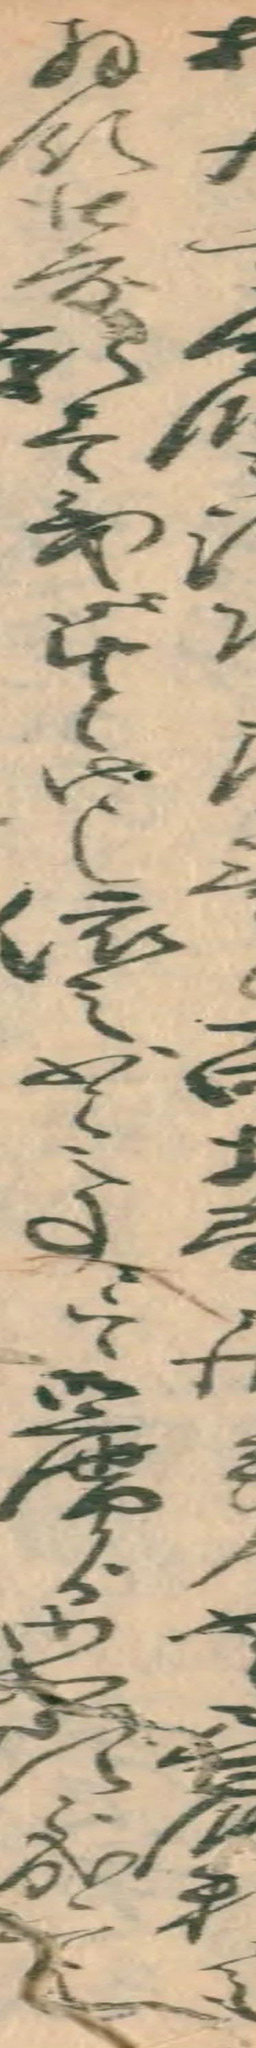拝領仕度願上候義ニ御座候由申候依之少々之事ニ候ハヽ御席ゟ御出頭被成候
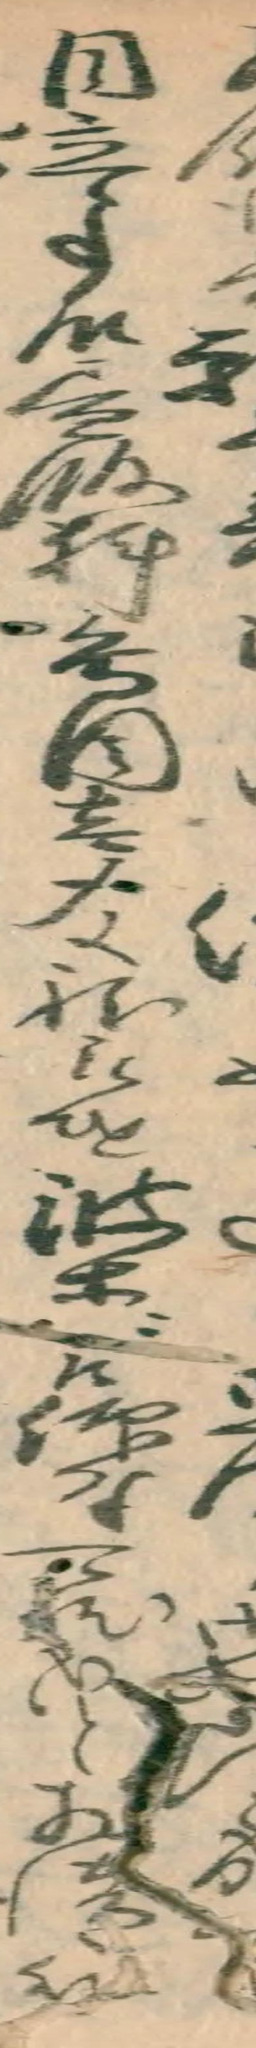目立候事故昼飯料鳥目壱貫文程被遣彼等ニ被仰付可然哉と相談候処
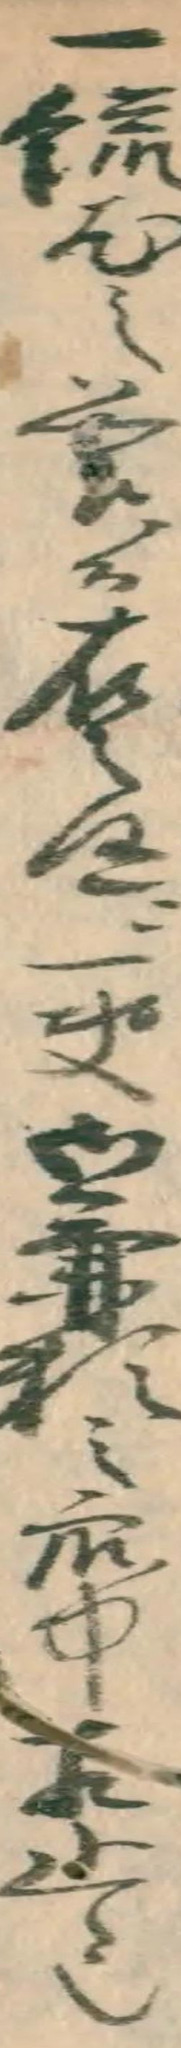一統尤之思召ニ而右之通ニ一決御兼頼之衆中相止候也
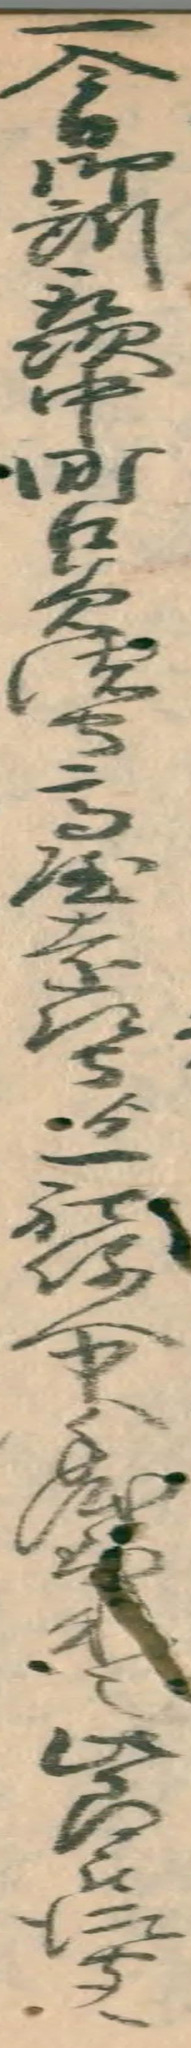一今日御所取次中町口美濃守高屋御遠江守ゟ一社役人中へ手紙到来也此間被仰聞候
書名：賀茂社記録. 第58冊
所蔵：国立国会図書館 National Diet Library, JAPAN
